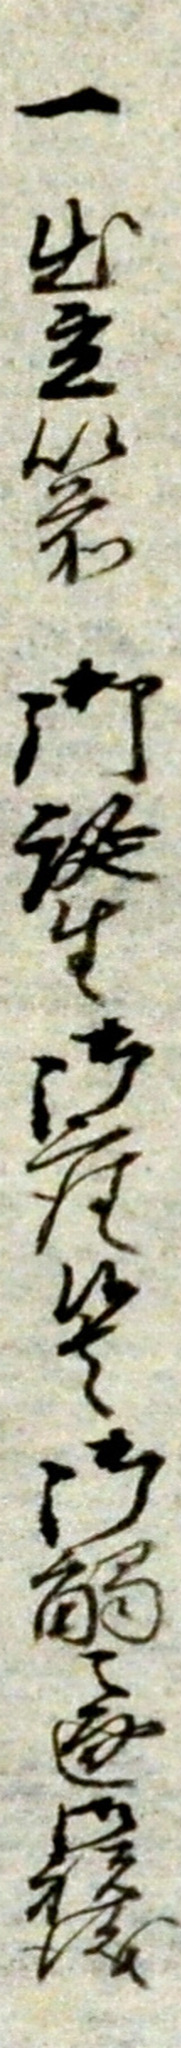一出立以前御誕生御座候は御触之通御祝儀
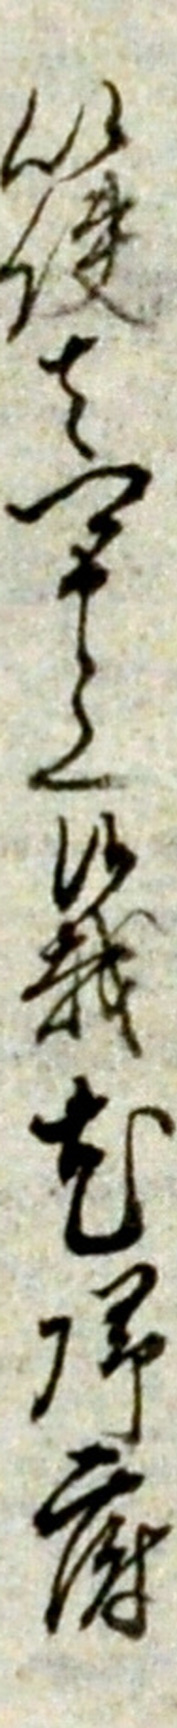以使者可申上候哉尤帰府
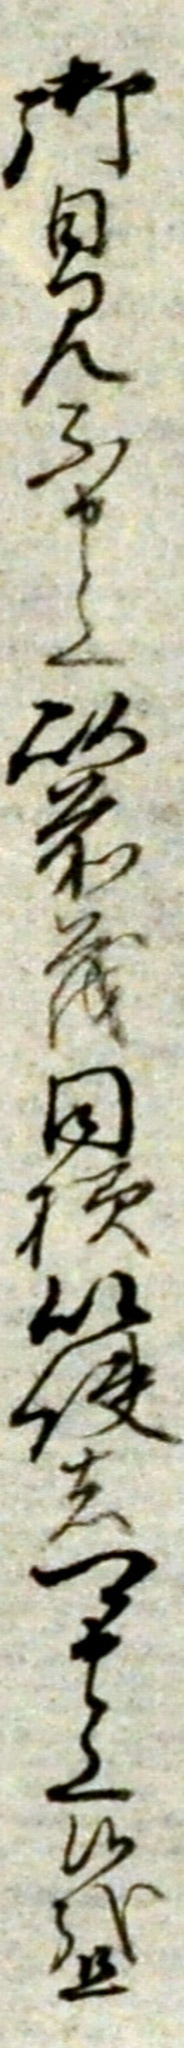御目見不申上以前も同様以使者可申上候哉且
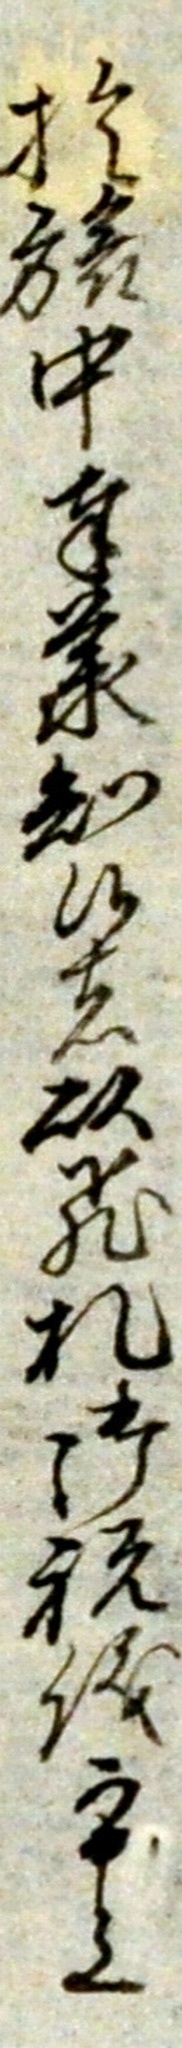於旅中奉承知候は以飛札御祝儀可申上
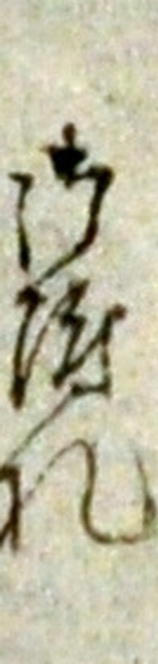御附札
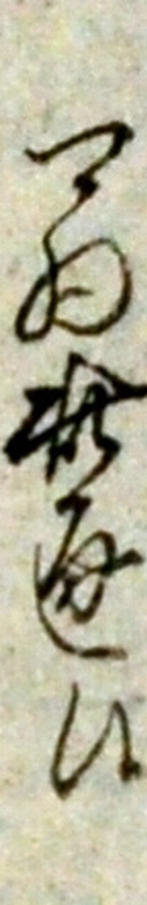可為此通候
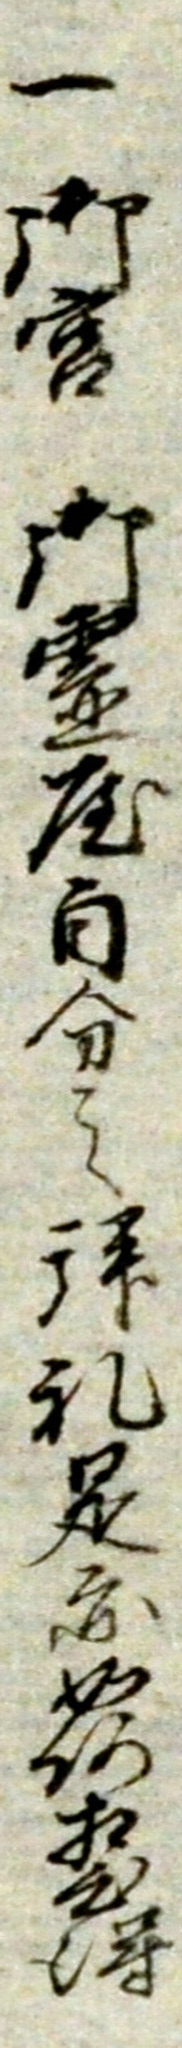一御宮御霊屋自分之拝礼是亦如何相心得
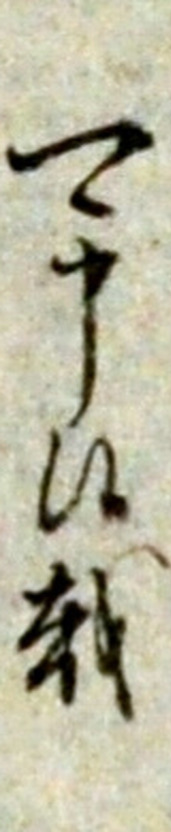可申候哉
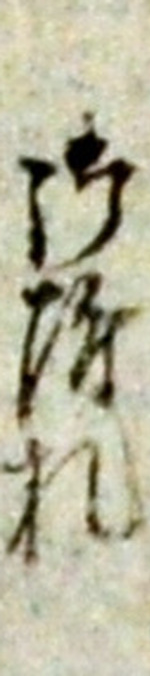御附札
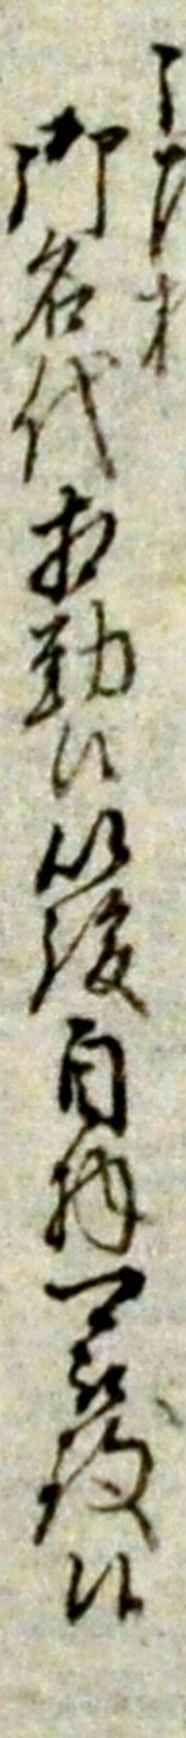御名代相勤候以後自拝可被致候
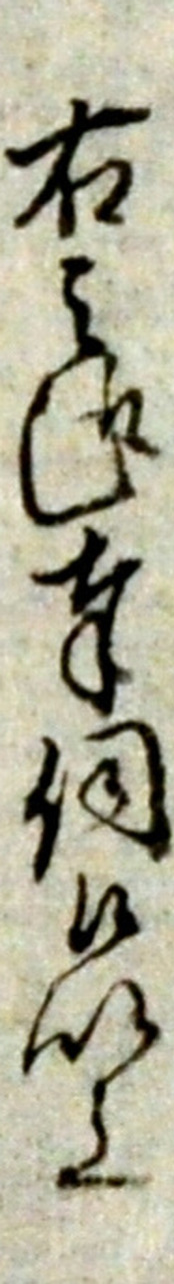右之趣奉伺候以上
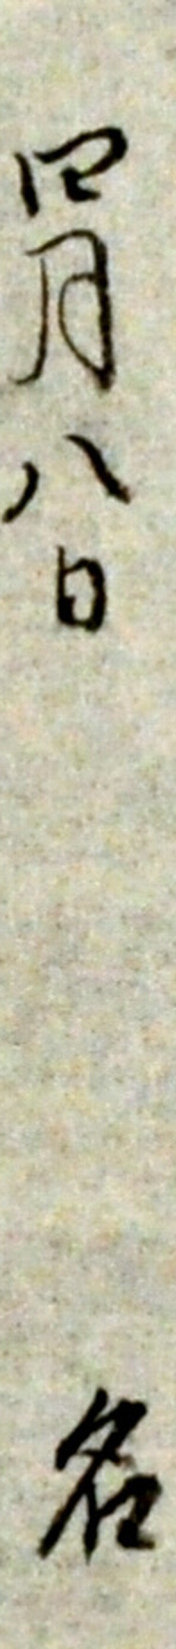四月八日名

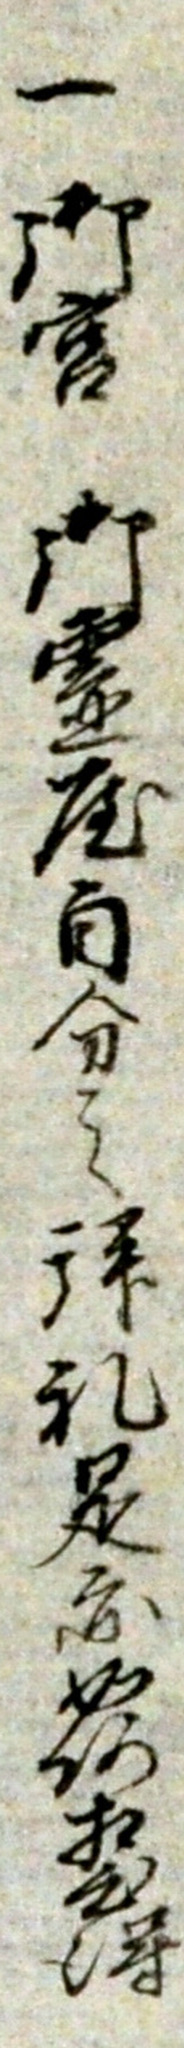一御宮御霊屋自分之拝礼是亦如何相心得
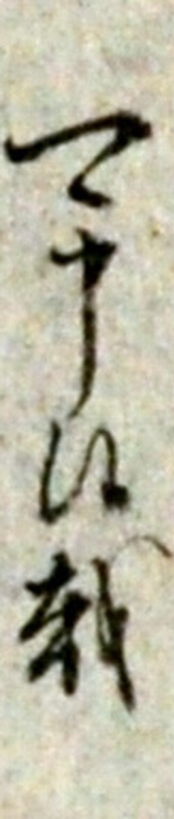可申候哉
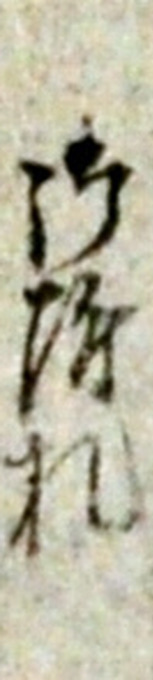御附札
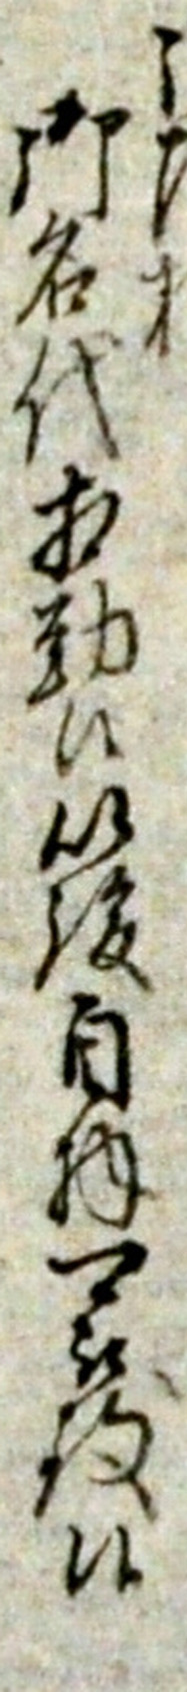御名代相勤候以後自納可被致候
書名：日光御名代相勤候節ノ留
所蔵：伊那市立高遠町図書館・合同会社AMANE
